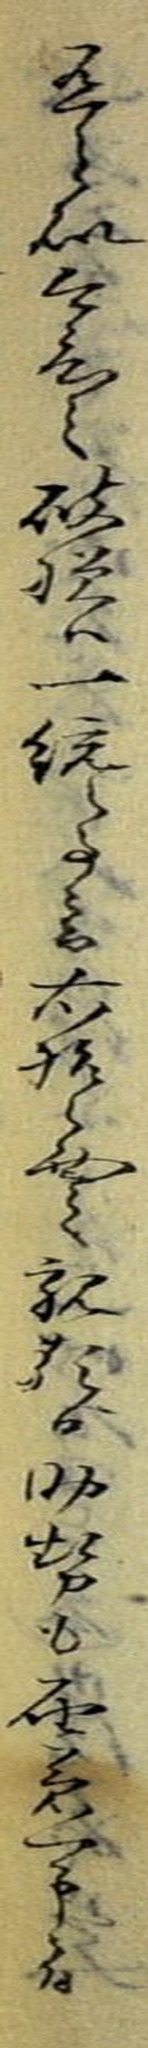有之候処今度之破損は一統之事に而右様之面々親類ゟ助勢も届兼可申候に付
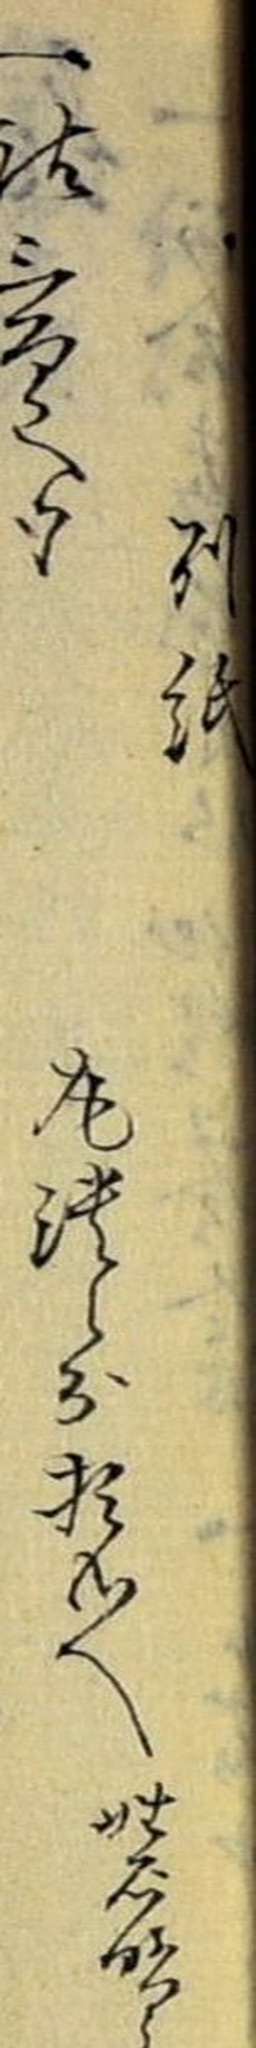一銀三百匁つヽ丸潰之分拾弐人姓名略之
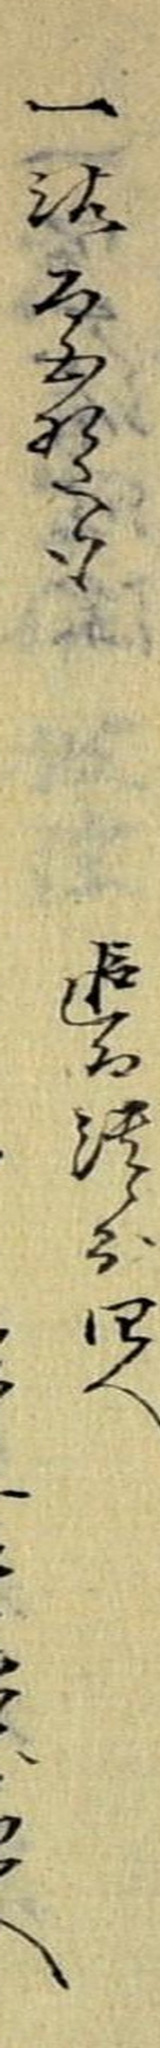一銀百五拾匁つヽ追々潰候分四人
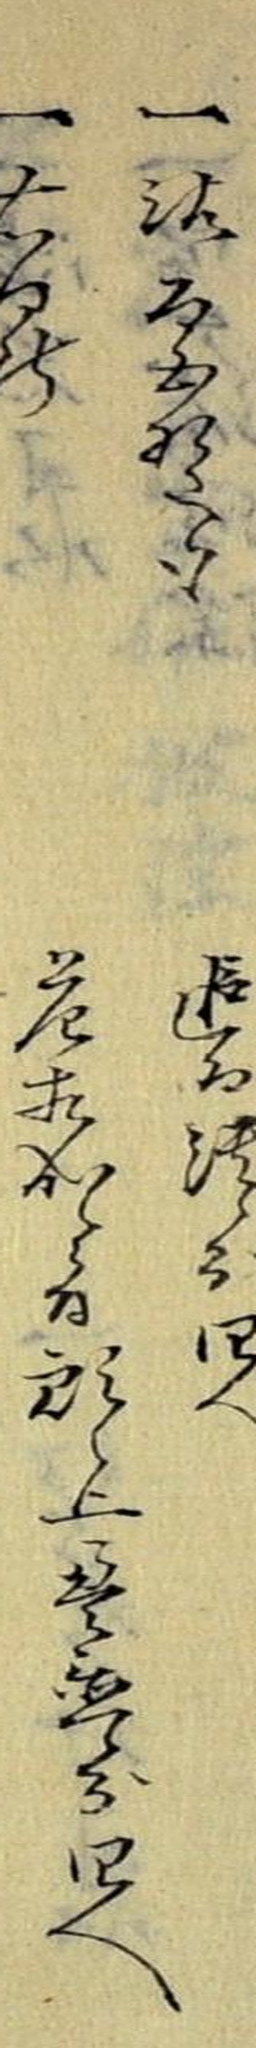一右同断危相成候に付願之上畳置候分四人
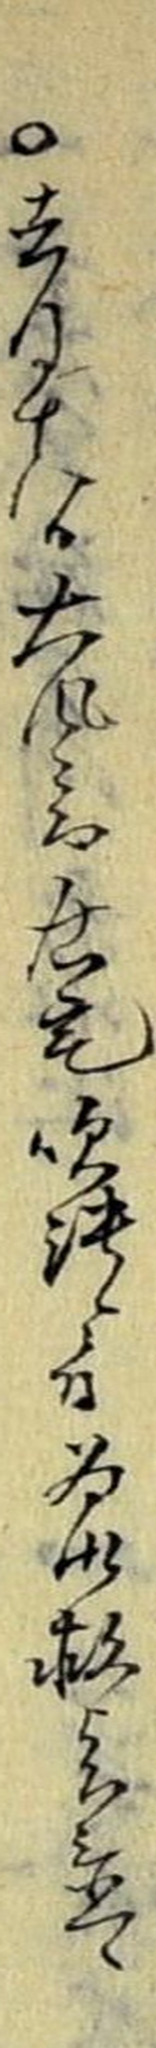○去月十八日大風に而居宅吹潰候に付為御救被下置候
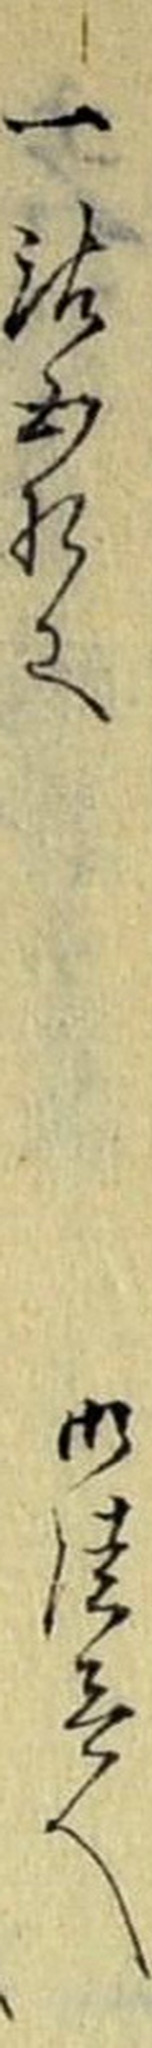一銀五拾匁御徒壱人
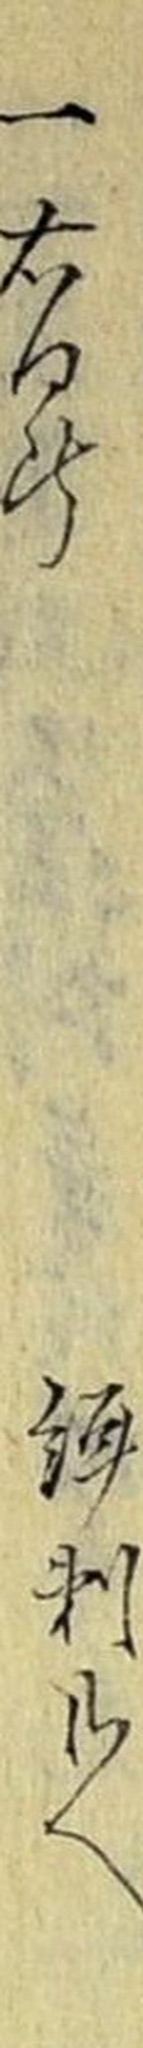一右同断餌刺弐人
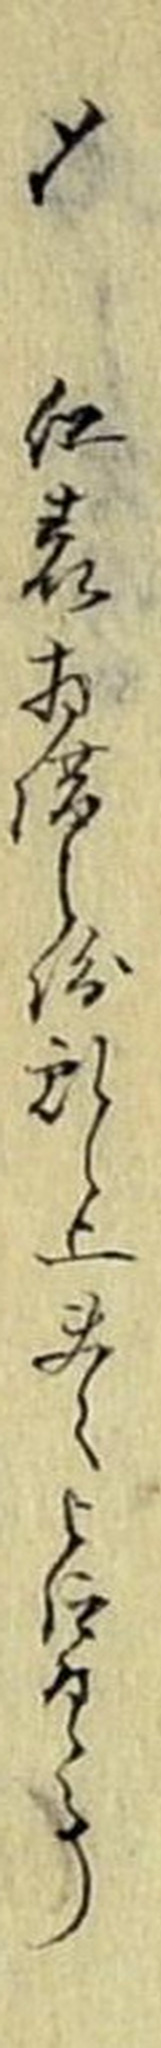〆但表拝借之儀願之上夫々被仰付候事
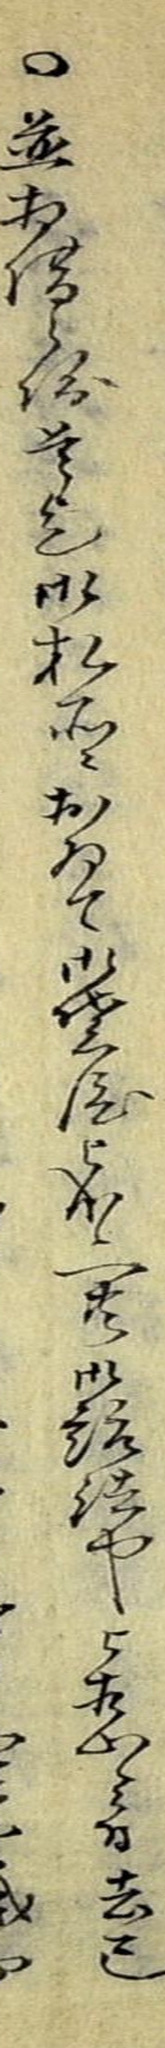○並拝借之儀是迄御札所におゐて御貸渡被成候へ共御趣法中被相止候に付去巳
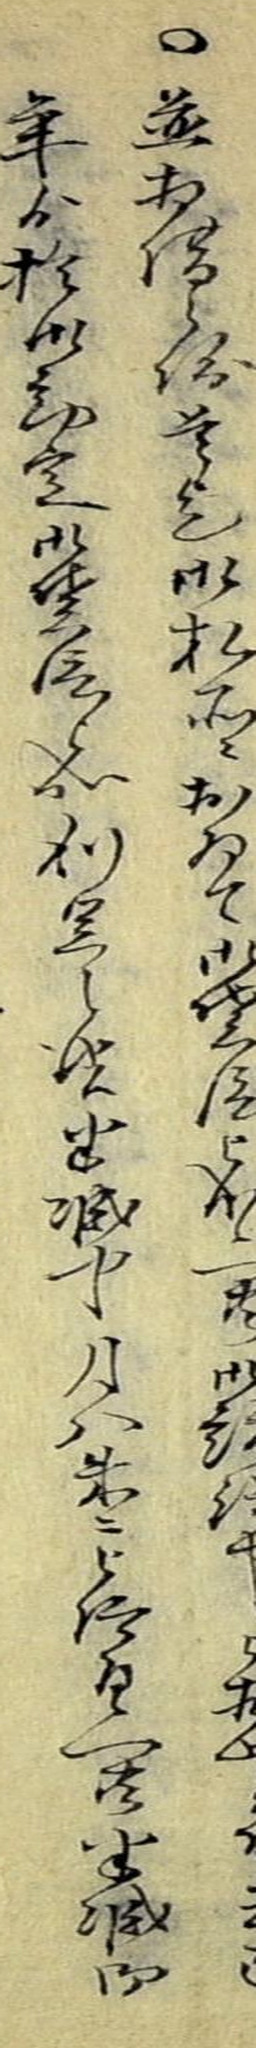年ゟ於御勘定御貸渡被成利息之儀は半減中月八朱に被仰付候へ共半減御
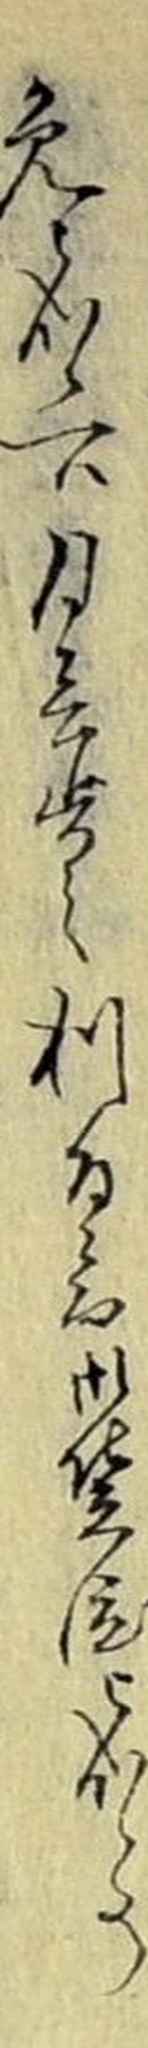免被成候へは月一歩之利付に而御貸渡被成候事
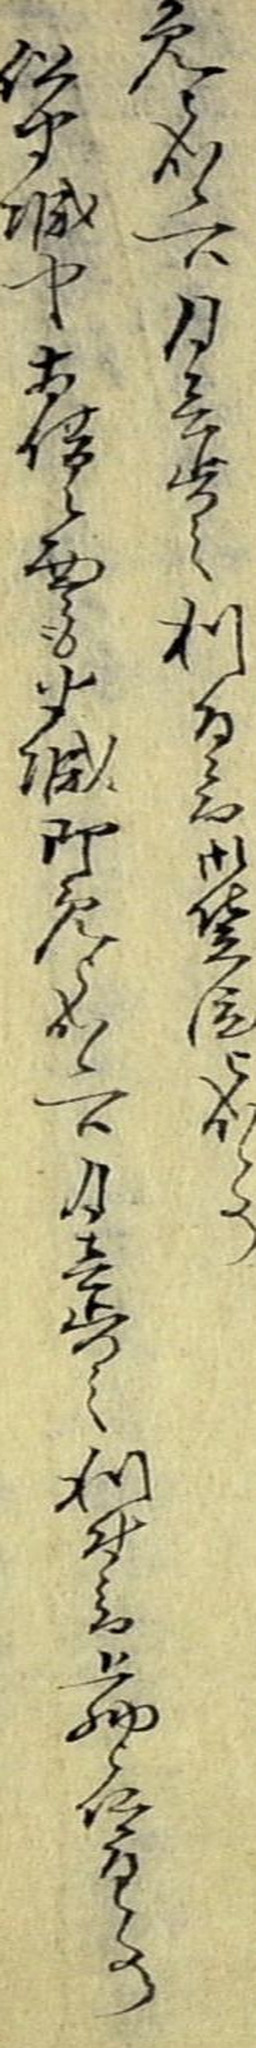但半減中拝借之面々も半減御免被成候へは月一歩之利付に而上納被仰付候事
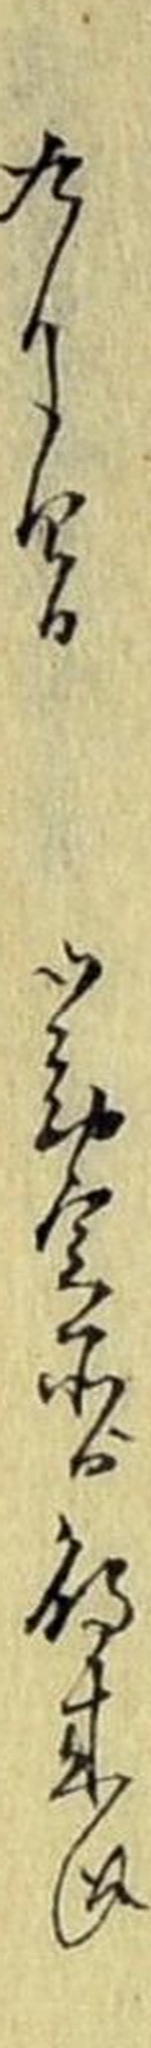九月四日御勘定所ゟ触来趣

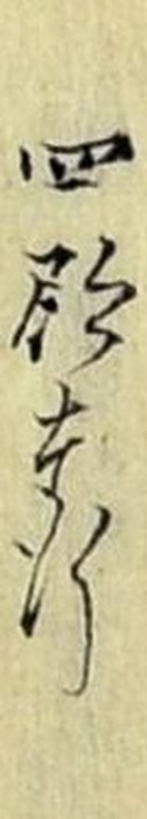四郡奉行
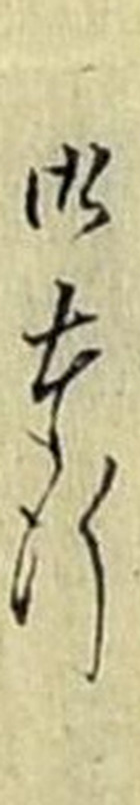御奉行
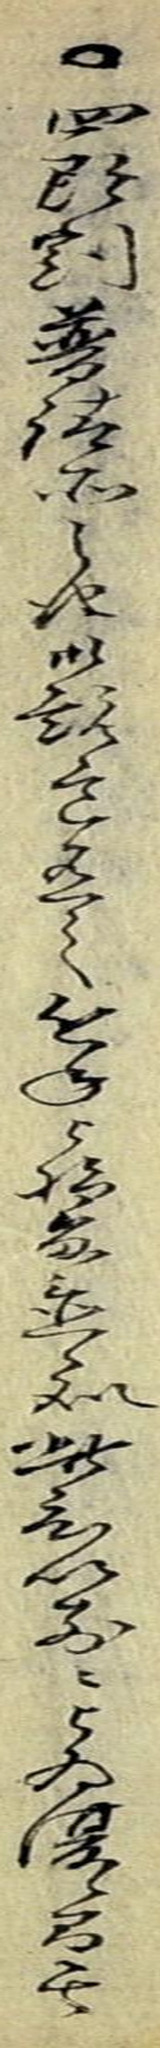○四郡割普請之儀御趣意有之近年被指留置候処此度以前に被為復候間其
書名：命令之部 六
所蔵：福井県文書館 Fukui Prefectural Archives
